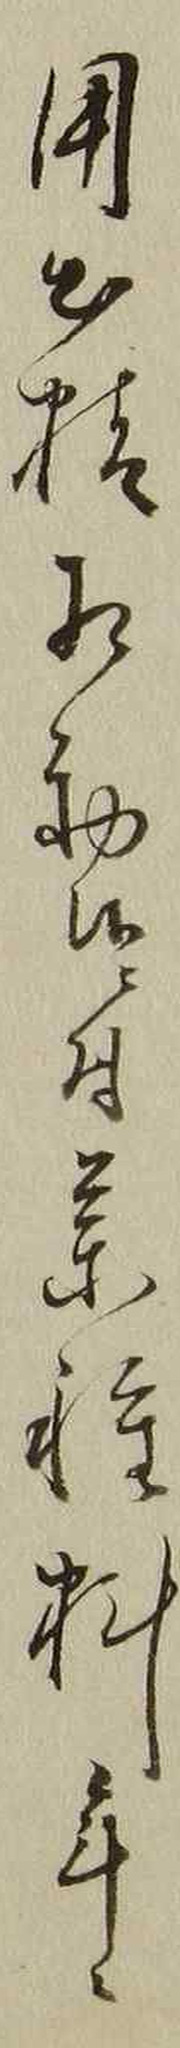用出精相勤候ニ付薬種料年ニ
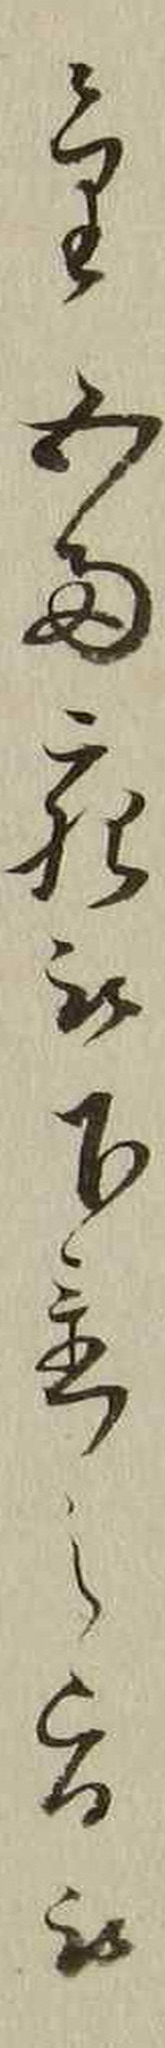金五両宛被下置之旨被
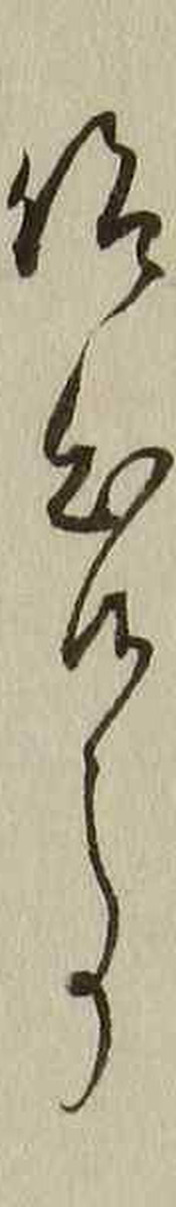仰出候事
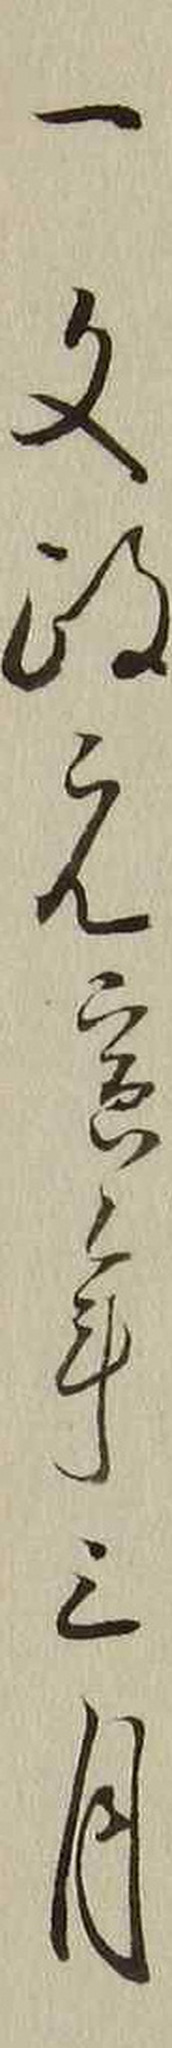一文政元寅年三月
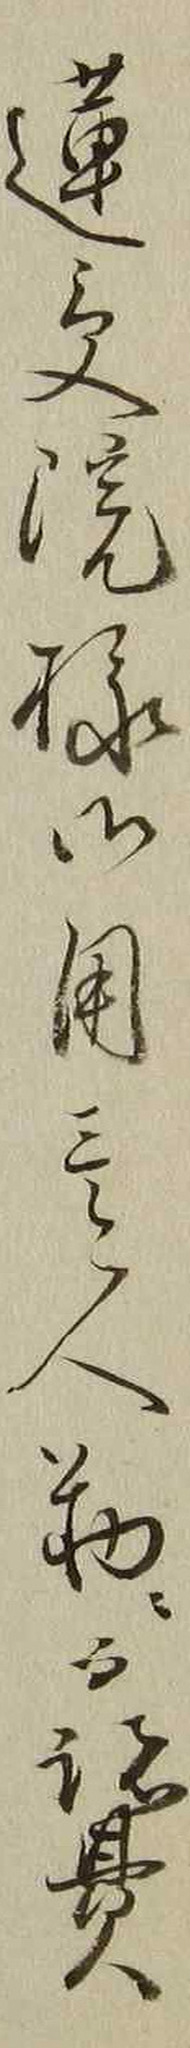蓮受院様御用壱人勤ニ而諸費
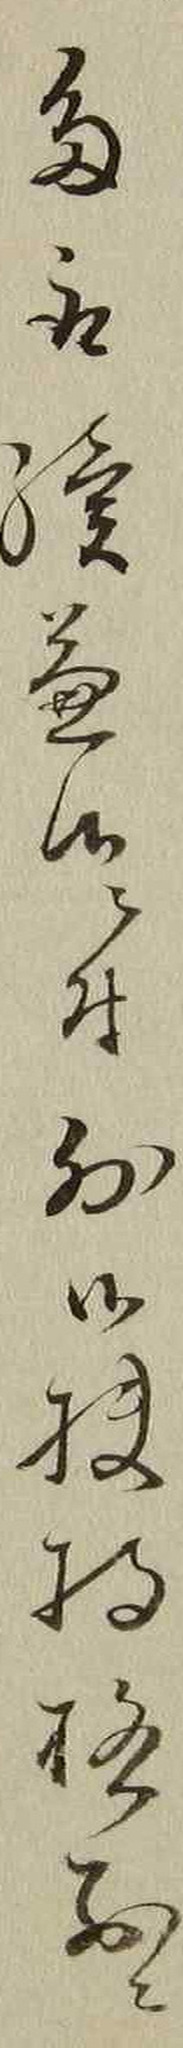多取続兼候ニ付外御扶持格別ニ
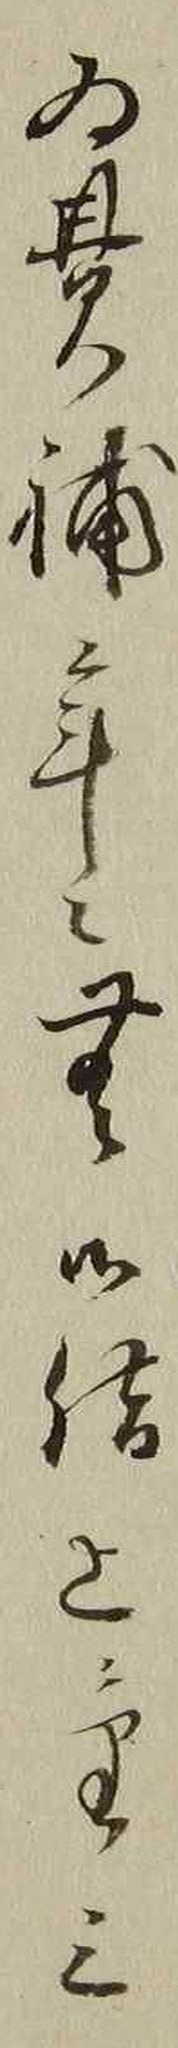為費補年々無御借上金三
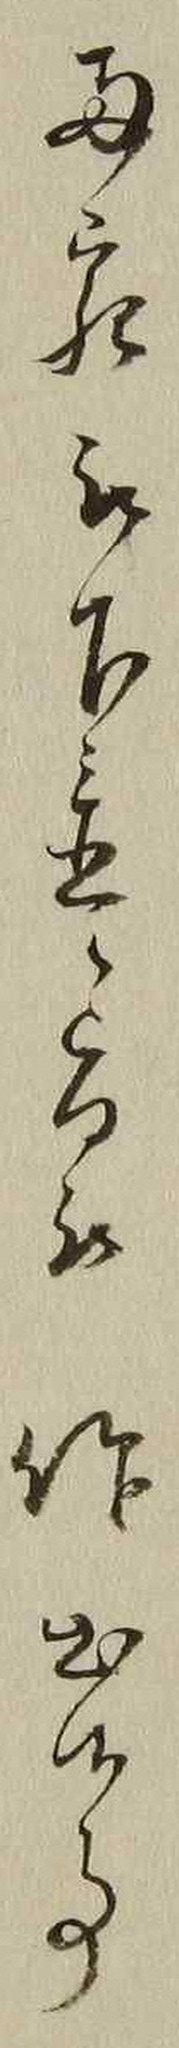両宛被下置候旨被仰出候事
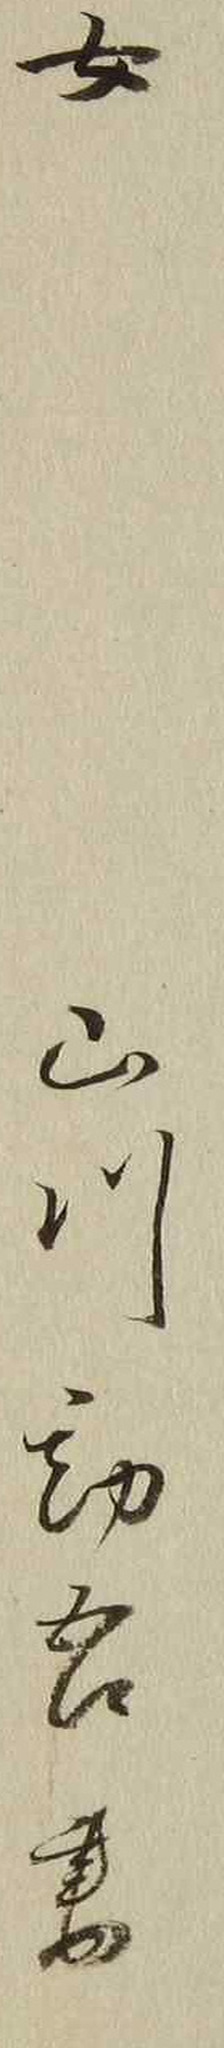女山川勘吾妻
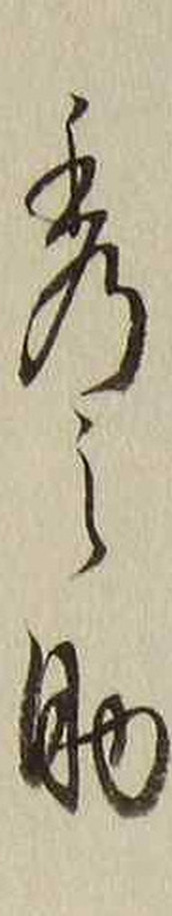秀之助
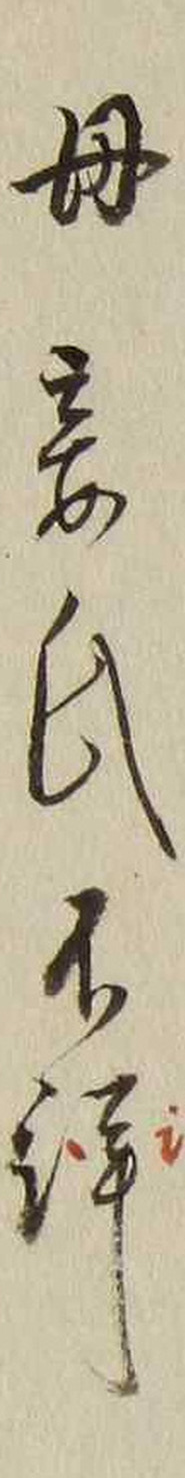母妾氏不詳

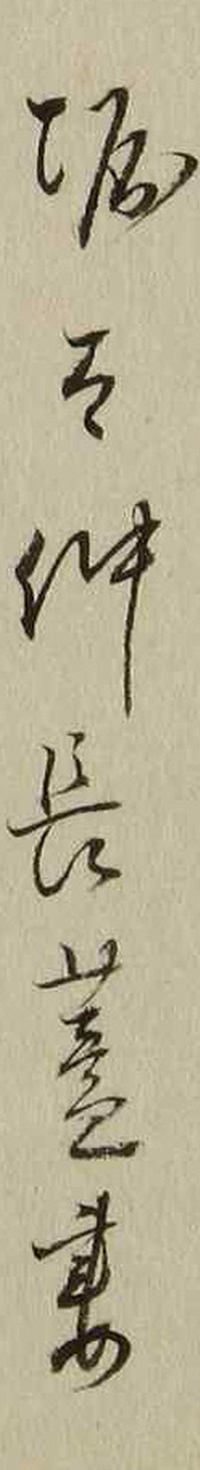女堀太仲長蓋妻

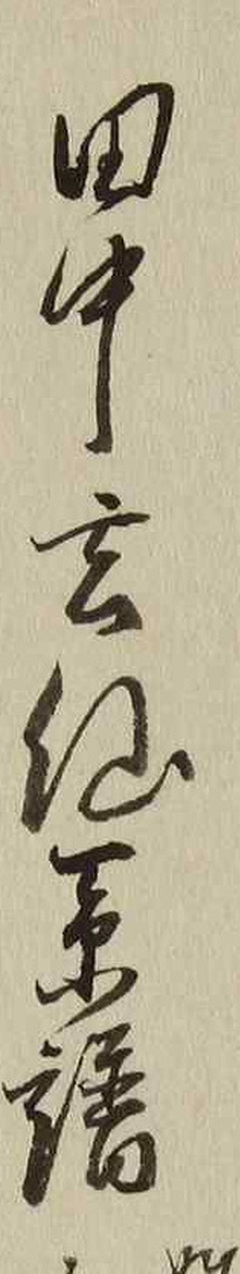田中玄仙元義
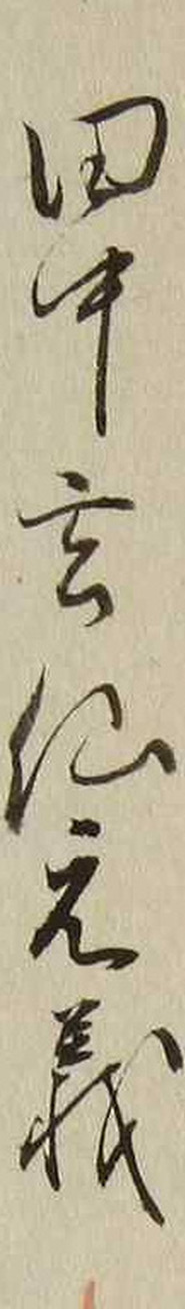田中玄仙元義
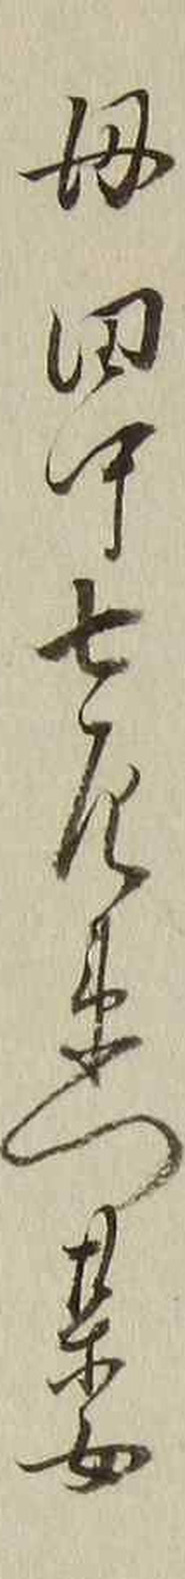母田中七左衛門某女
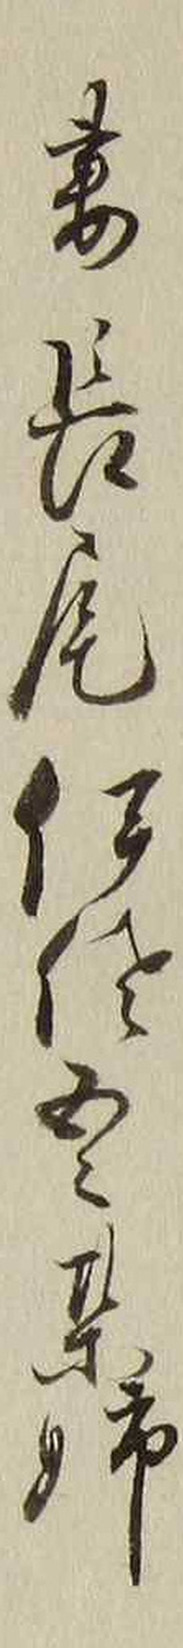妻長尾仁佐吾某姉
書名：諸士系譜　巻之129　た之部5
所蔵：会津若松市立会津図書館
